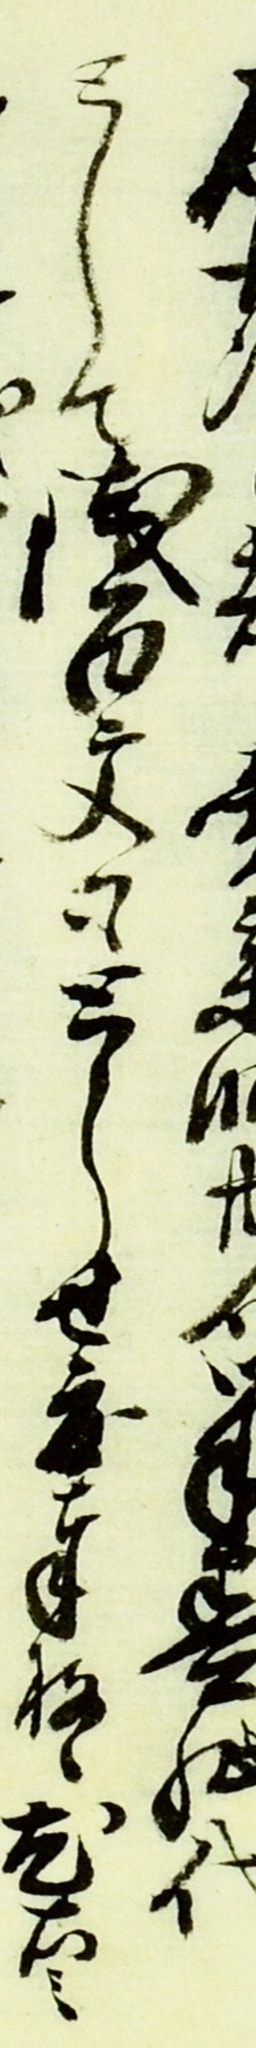として銭百文ツヽとらせ度奉存候尤右之
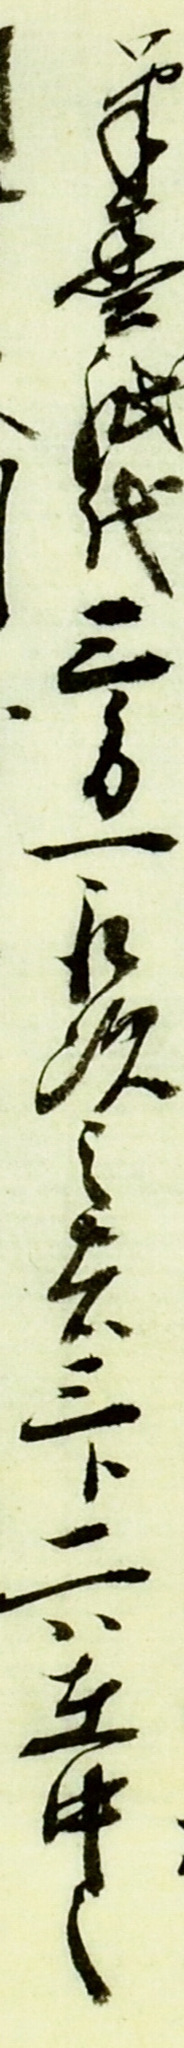筆墨紙代三分一取次之者三分二ハ在中之
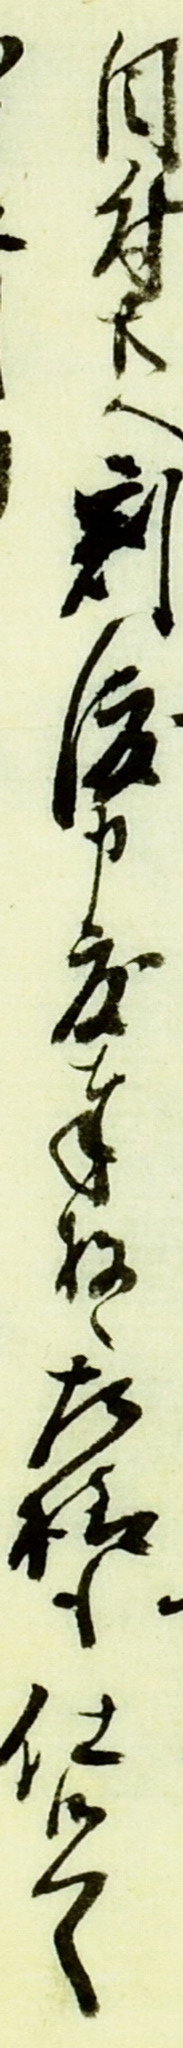目付共へ割渡申度奉存候左様も仕候ハヽ
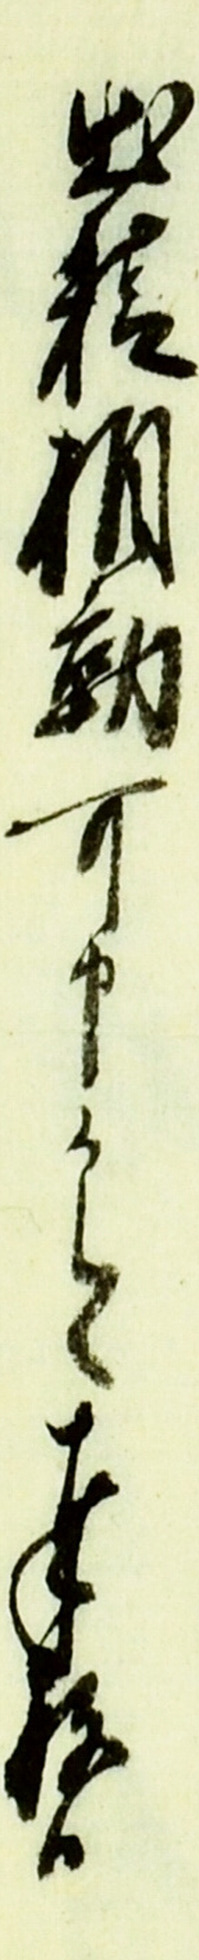出精相勤可申かと奉存候
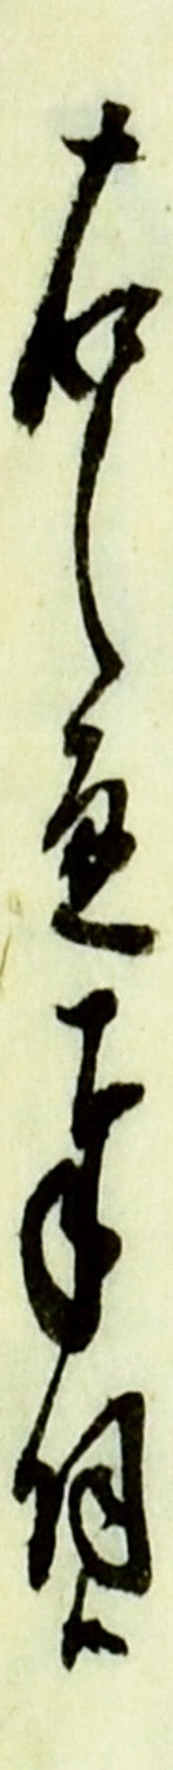右之通奉伺候
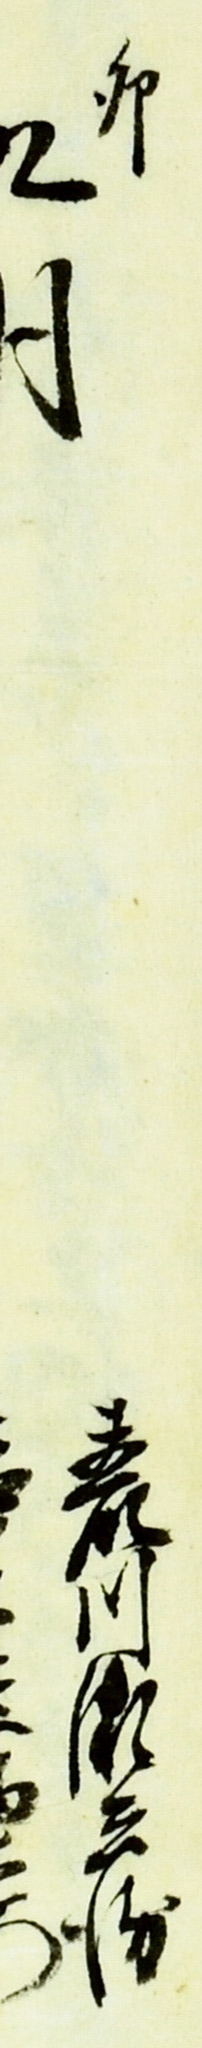卯荒川瀬兵衛
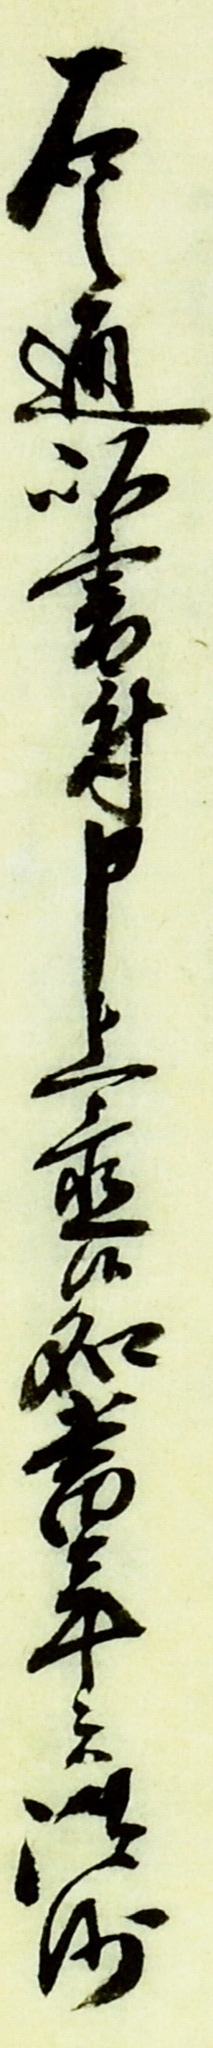右之通以書付申上置候処当年者御沙
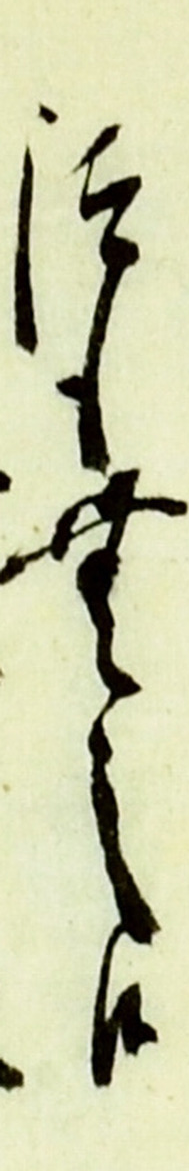汰も無之候
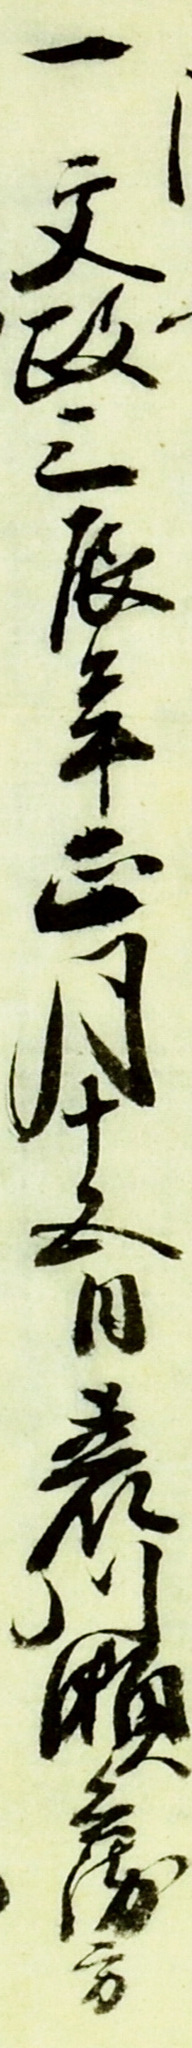一文政三辰年正月十五日荒川瀬兵衛方
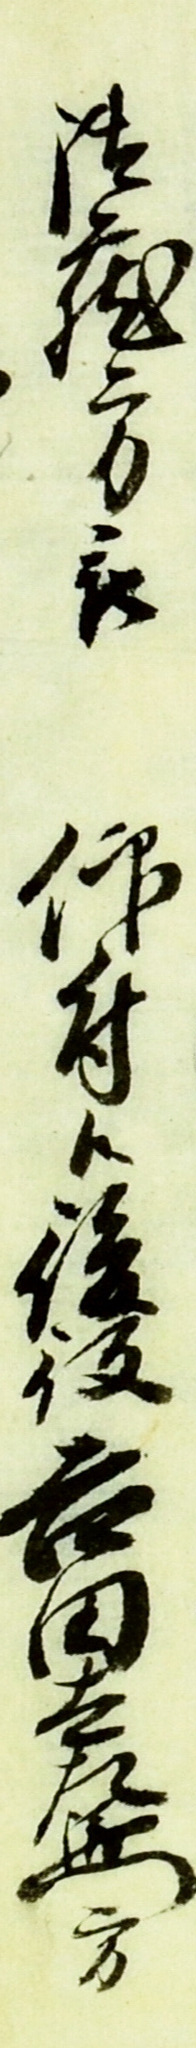御蔵方被仰付候後役吉田太左衛門方
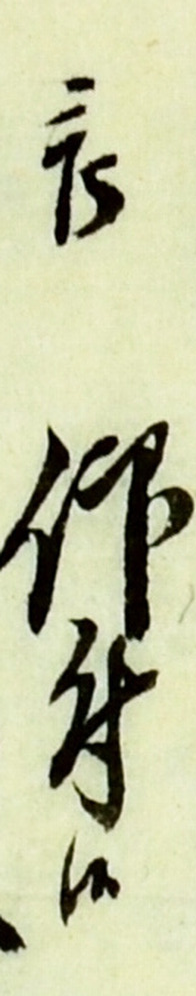被仰付候
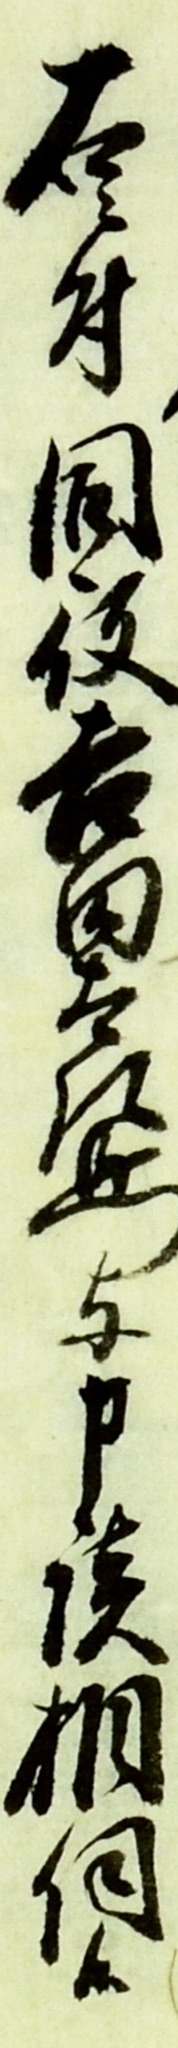右ニ付同役吉田太左衛門与申談相伺候
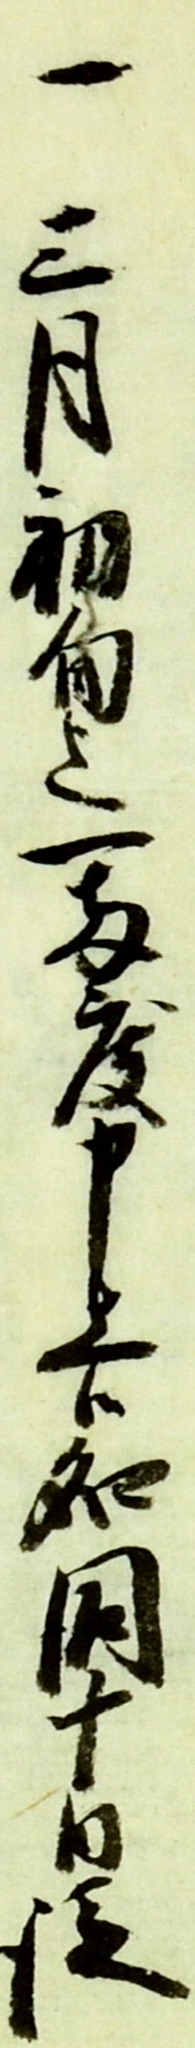一三月初旬迄一両度申上候処同十日従
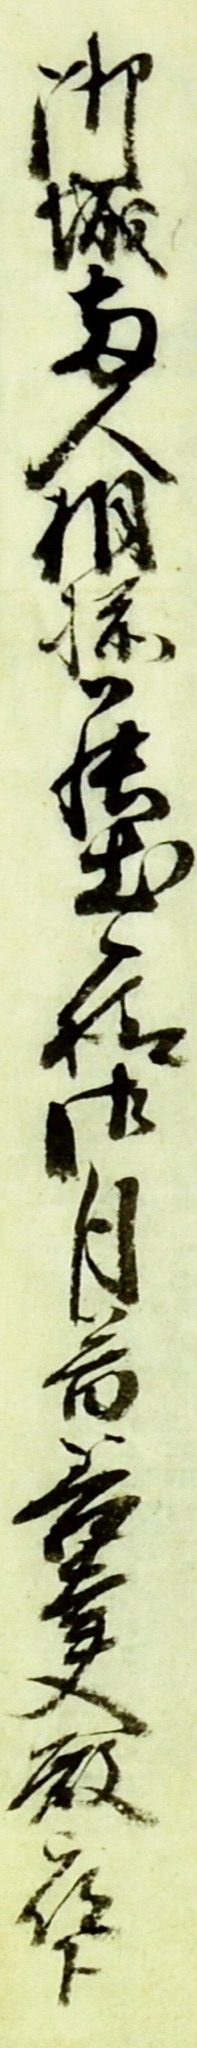御城両人相揃罷出候様御月番善太夫殿被仰下

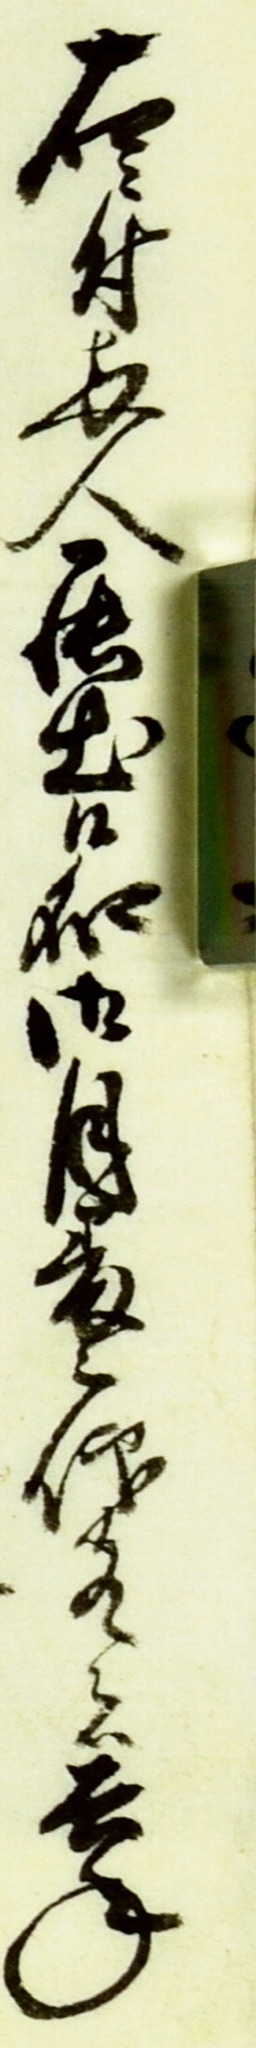右ニ付両人罷出候処御月番被仰付聞候者去年
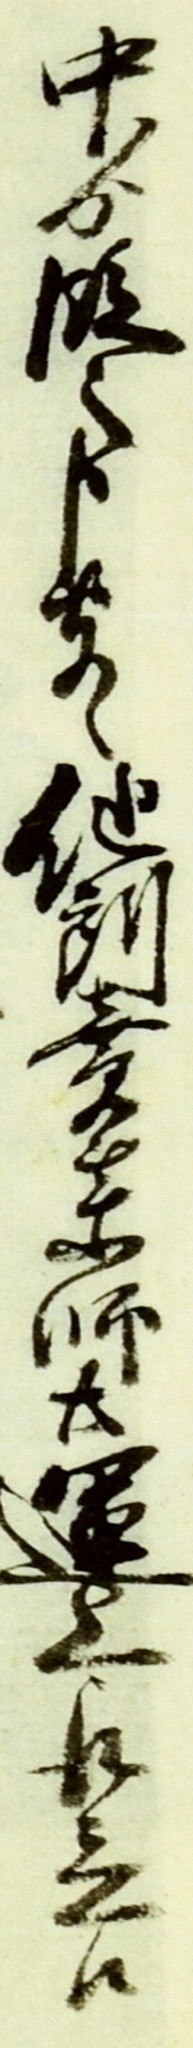中ゟ段々申聞候他所売薬師共運上取立候
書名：他国賣薬師運上之事
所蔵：伊那市立高遠町図書館・合同会社AMANE
